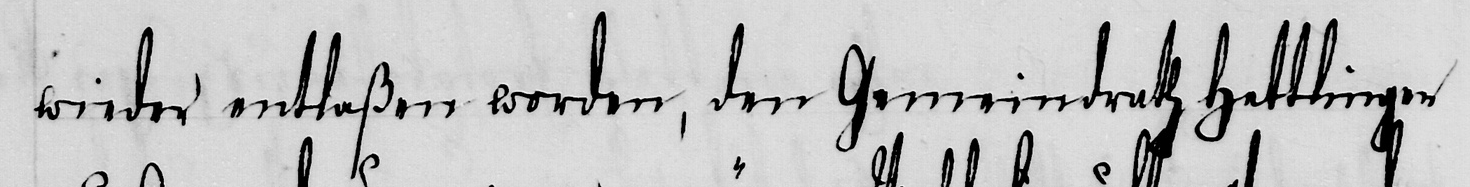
wieder entlaßen worden, den Gemeindrath Hettlingen
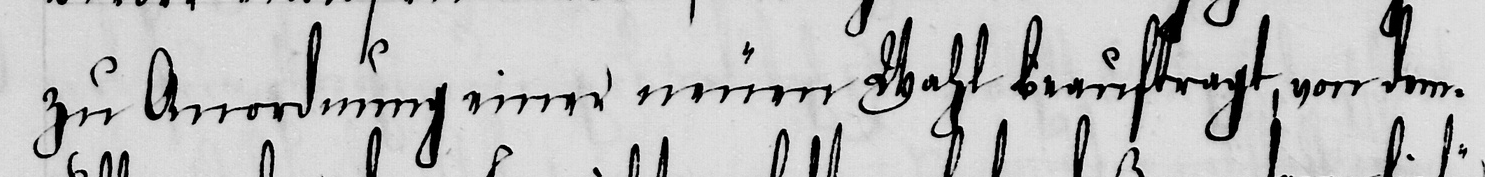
zu Anordnung einer neuen Wahl beauftragt, von dem¬
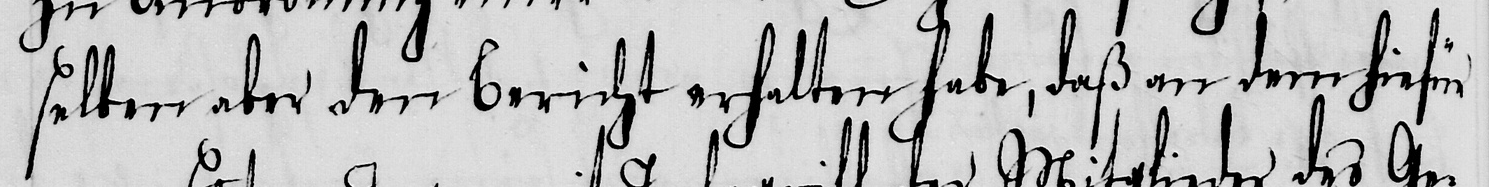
selben aber den Bericht erhalten habe, daß an dem hiefür
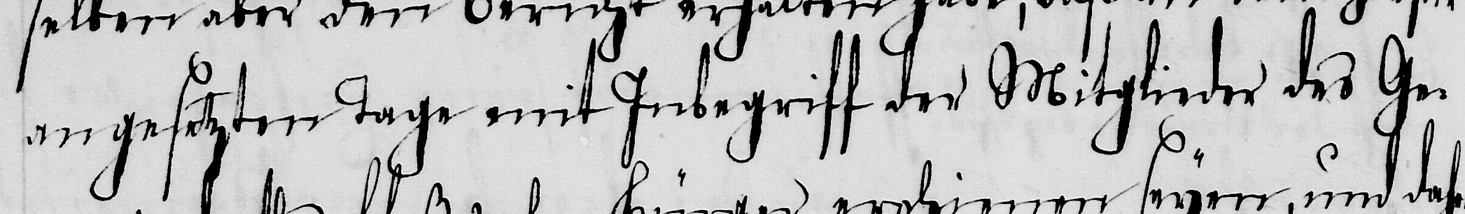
angesetzten Tage mit Inbegriff der Mitglieder des Ge¬
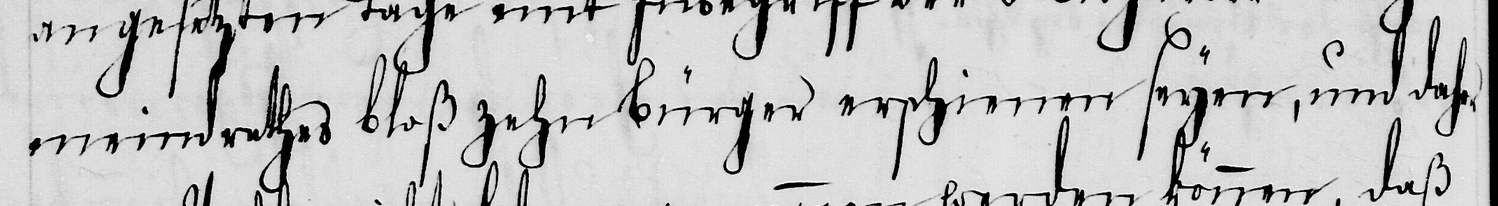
meindrathes bloß zehn Bürger erschienen seyen, und dah¬
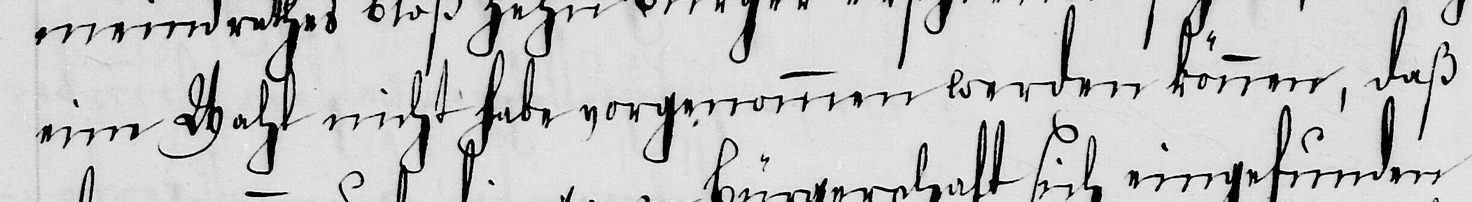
eine Wahl nicht habe vorgenommen werden können, daß
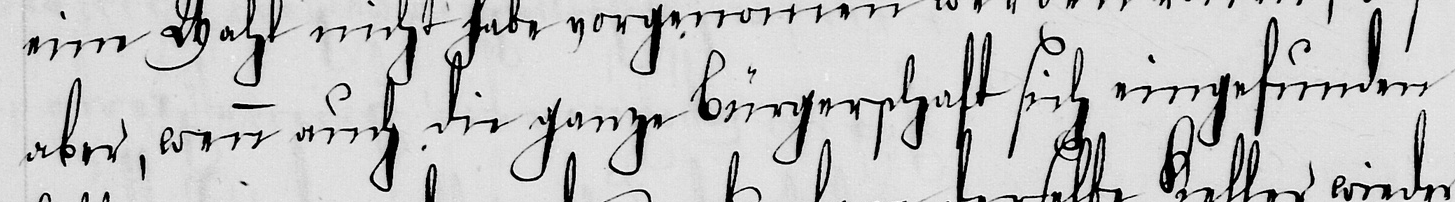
aber, wenn auch die ganze Bürgerschaft sich eingefunden
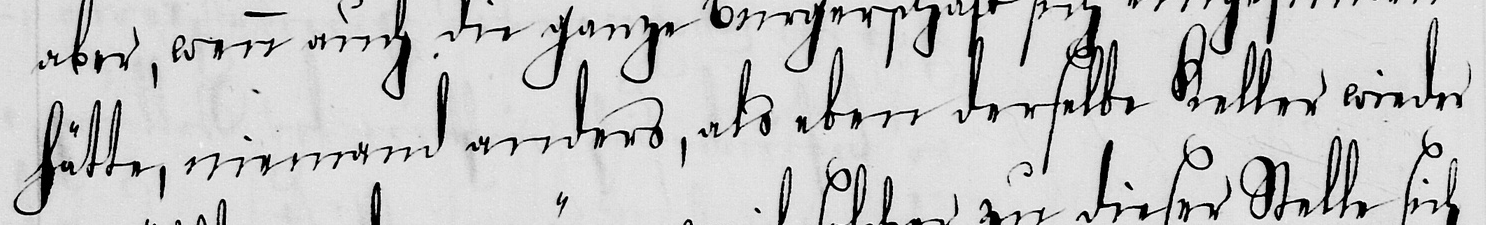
hätte, niemand anders, als eben derselbe Keller wieder
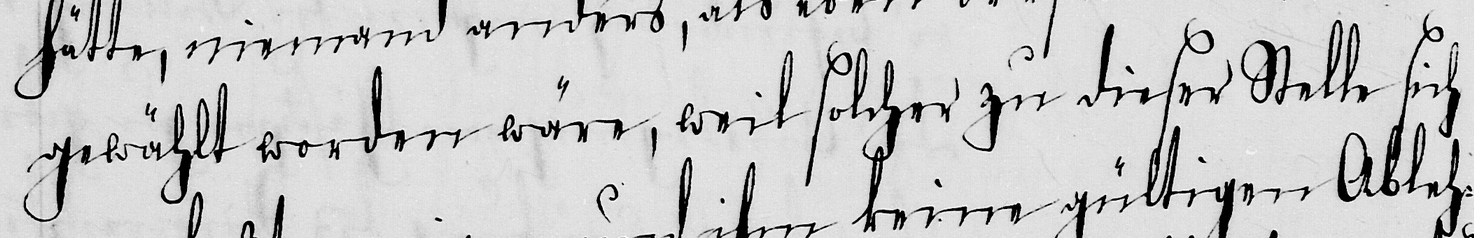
gewählt worden wäre, weil solcher zu dieser Stelle si¬
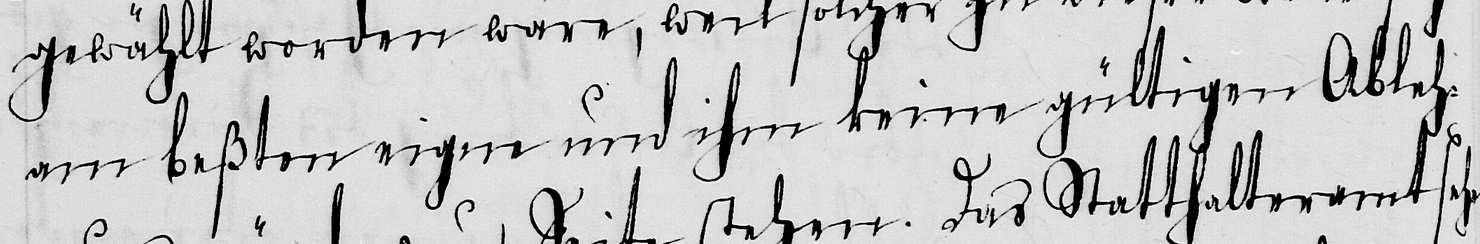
am beßten eigne und ihm keine gültigen Ableh¬
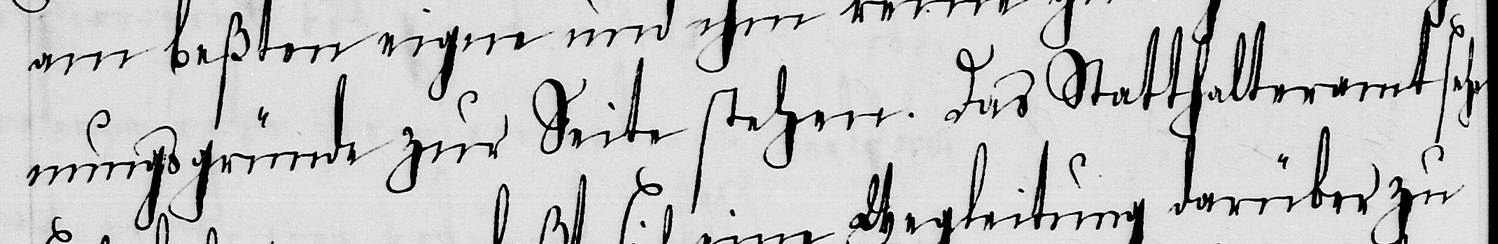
nungsgründe zur Seite stehen. Das Statthalteramt sehe
